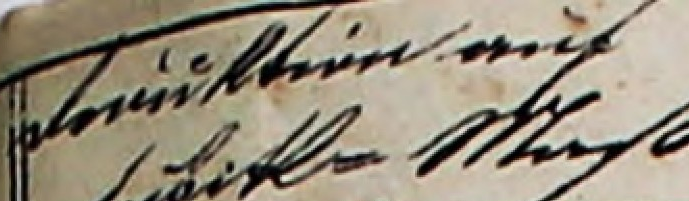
Reduktion auf
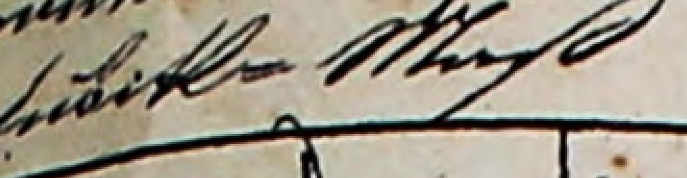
Cubik= Maß
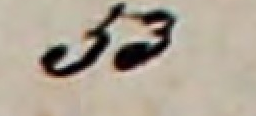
53
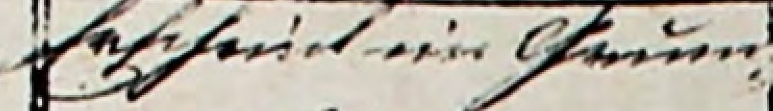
Erscheint im Grund„
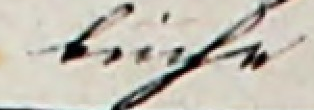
buche
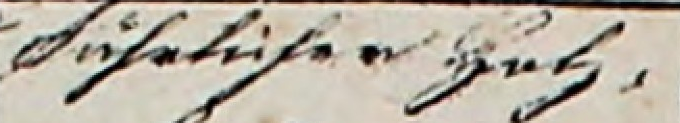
Jährlicher Holz„
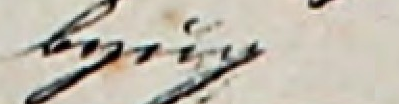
bezug
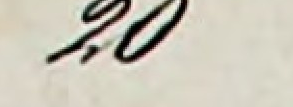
20
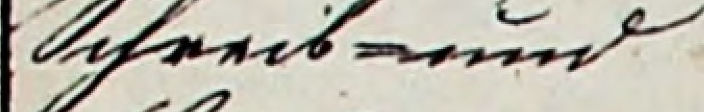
Schreib = und
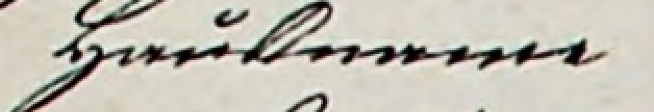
Hausmann
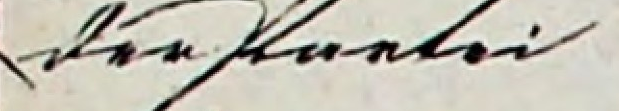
der Partei
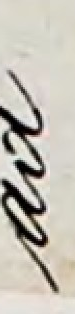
ad
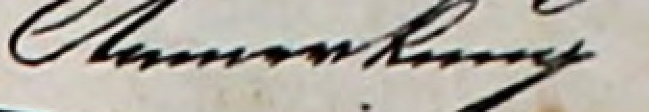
Anmerkung
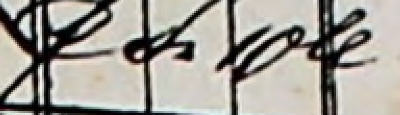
???
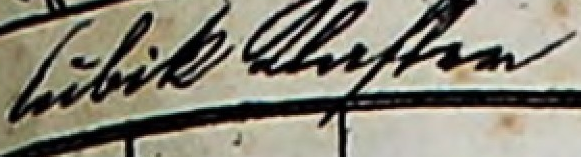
Cubik Klafter
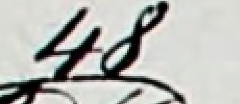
48
